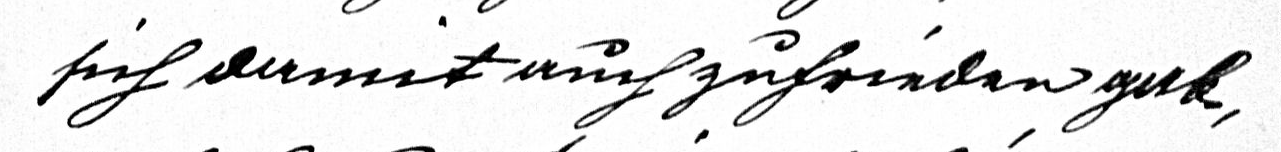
sich damit auch zufrieden gak,
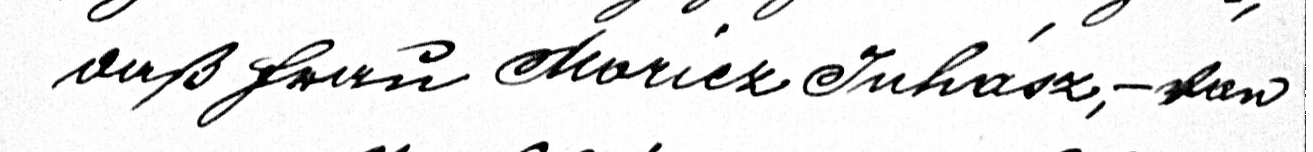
daß frau Moricz Inhász, - von
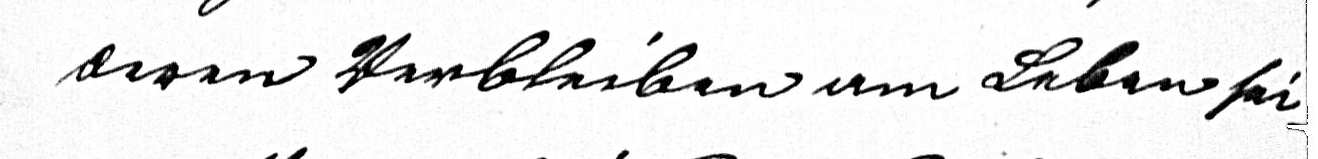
deren Verbleiben am Leben sei¬
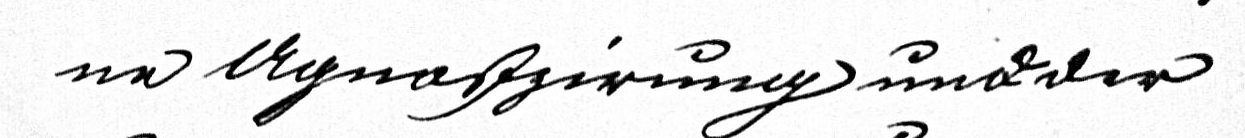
ne Agnoszirung und der
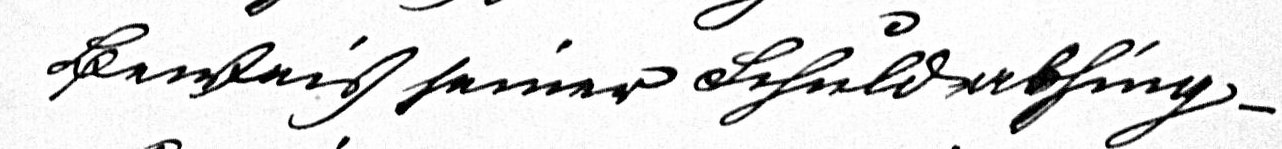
Beweis seiner Schuldabsing -
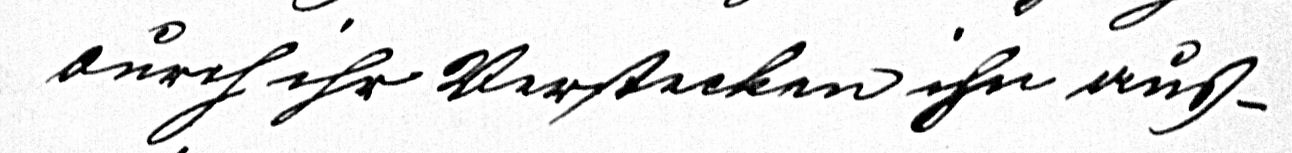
durch ihr Verstecken ihn aus¬
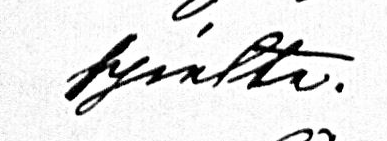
spielte.
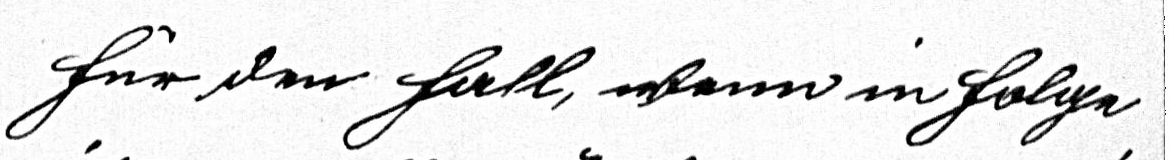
Für den Fall, wenn in Folge
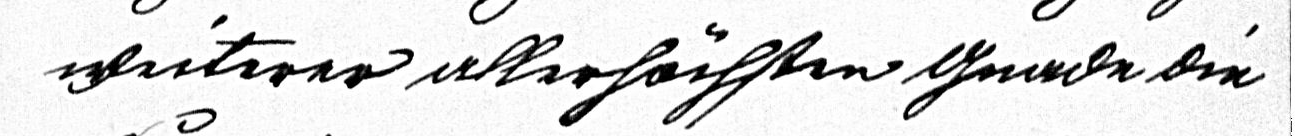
weiterer allerhöchsten Gnade die
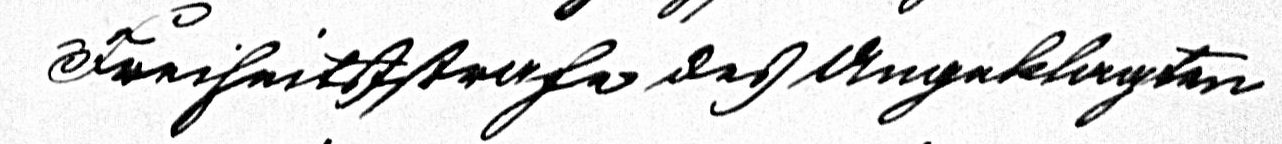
Freiheitsstrafe des Angeklagten
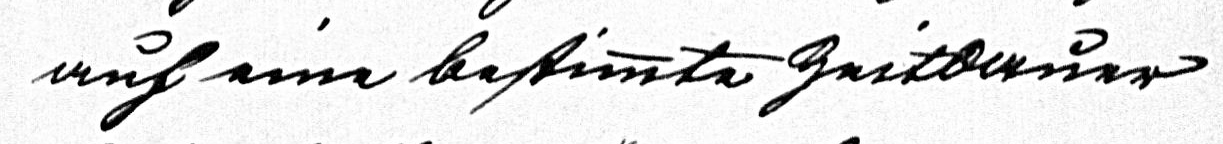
auf eine bestimmte Zeitdauer
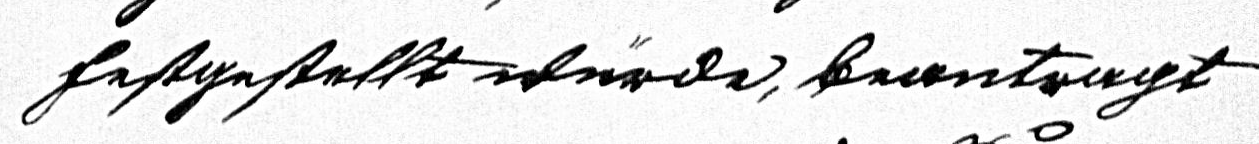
festgestellt würde, beantragt
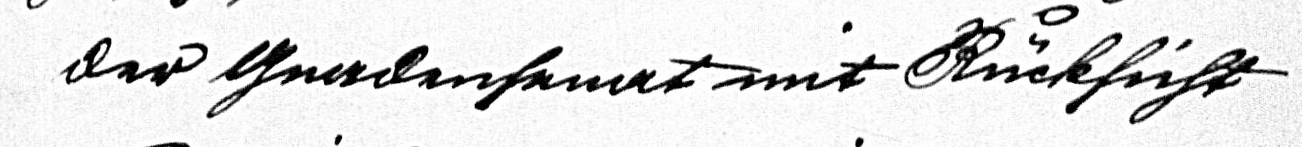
der Gnadensenat mit Rücksicht
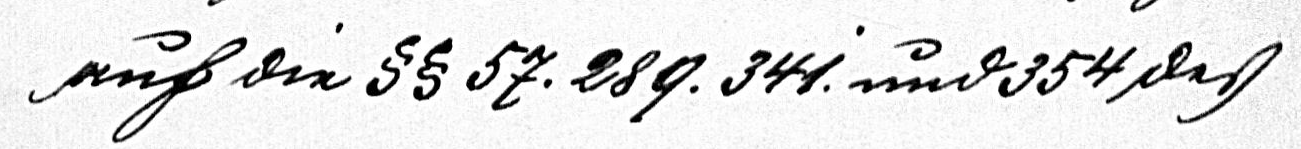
auf die §§ 57.289.341. und 354 des
